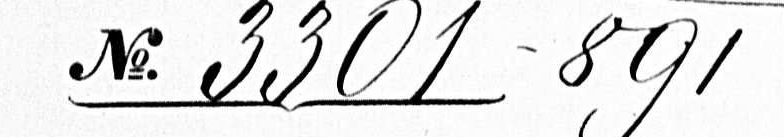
No. 3301 - 1891
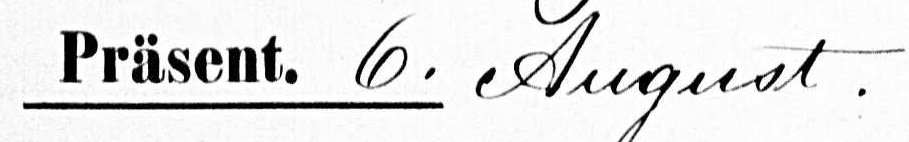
Präsent. 6. August
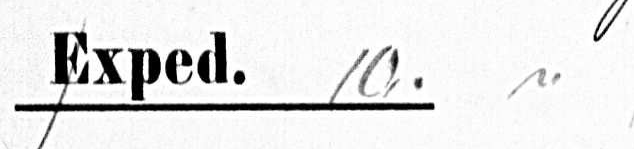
Exped. 10. „
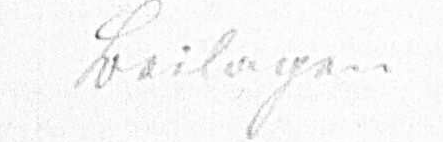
Beilagen
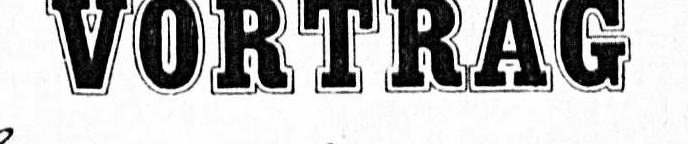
VORTRAG
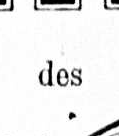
des
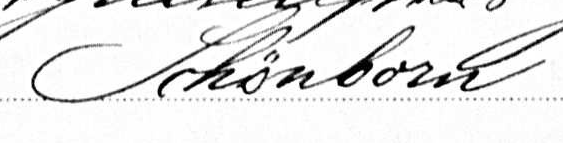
Schönborn
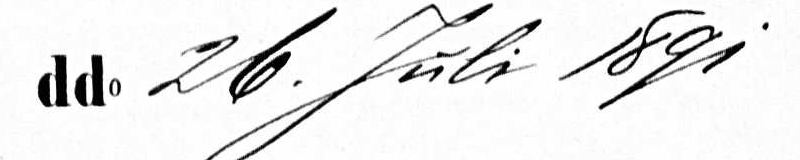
ddo 26. Juli 1891
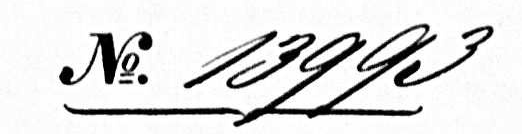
No. 13993
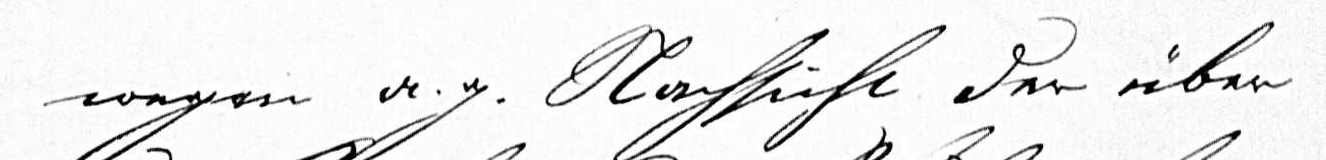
wegen a.g. Nachsicht der über
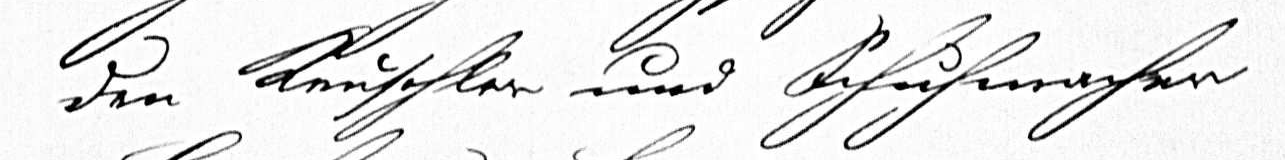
den Keuschler und Schuhmacher
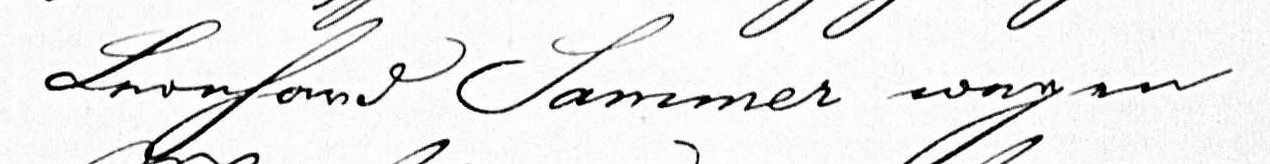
Leonhard Sammer wegen
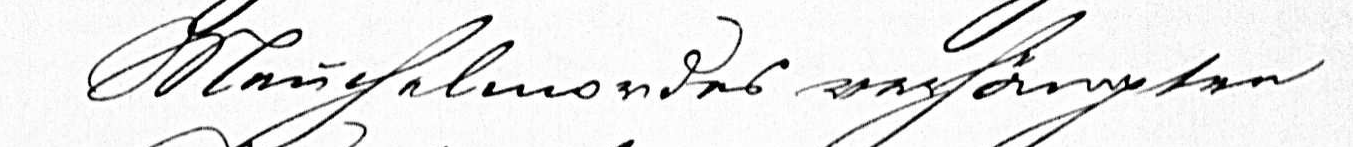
Meuchelmordes verhängten
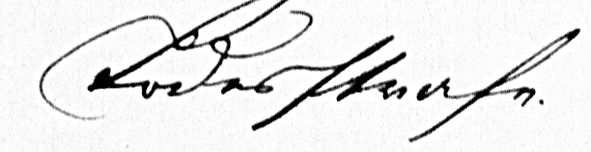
Todesstrafe.
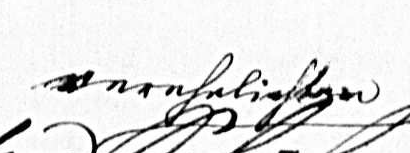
verehelichten
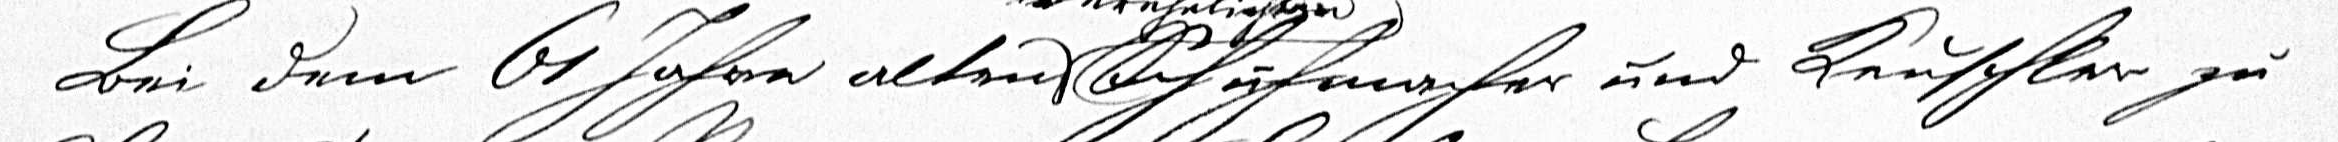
Bei dem 61 Jahre alten Schuhmacher und Keuschler zu
